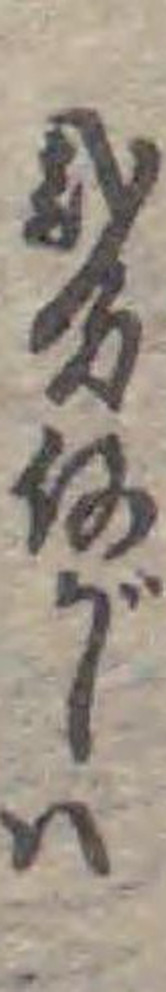弐分何がしは
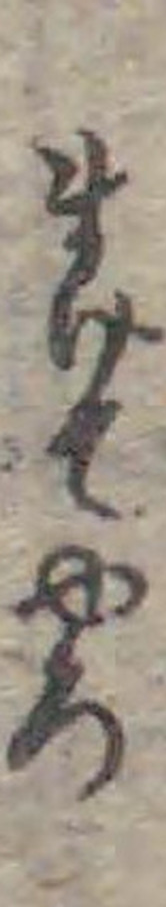まけてやろ
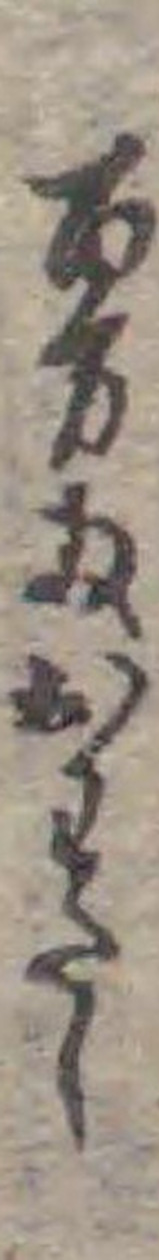百万両おわたし
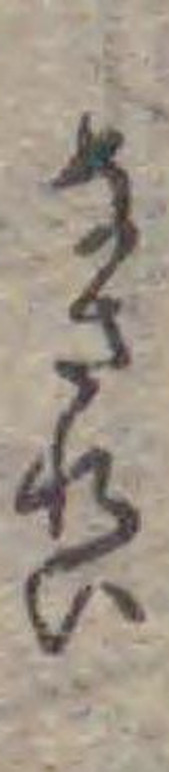なされい

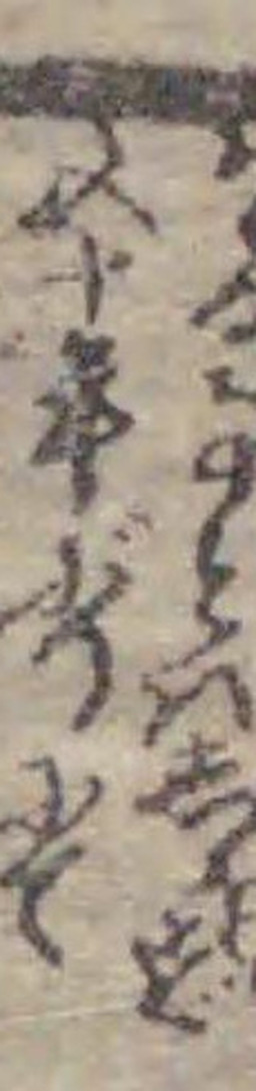五十年ぶりにて
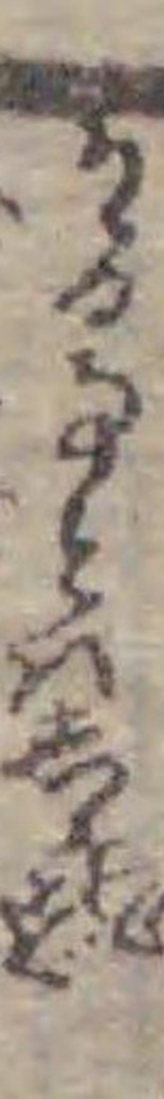かゝる事とはしらず
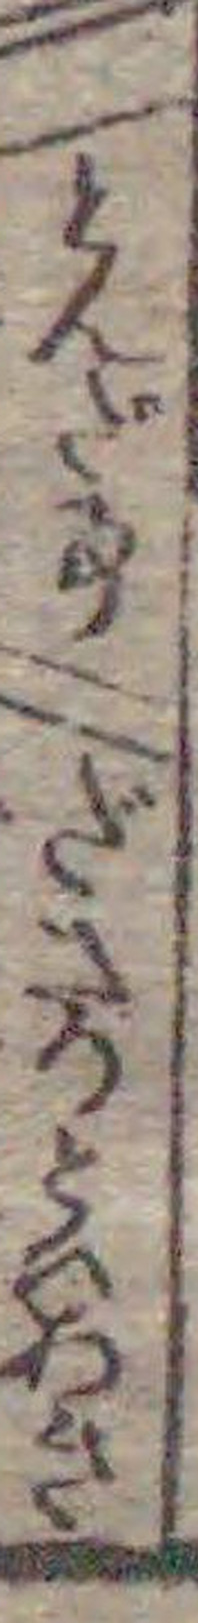とんだ事ださりとはあき
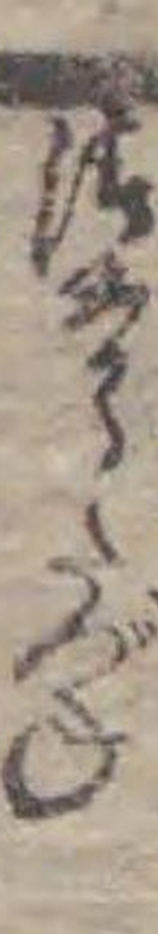清太郎たづね
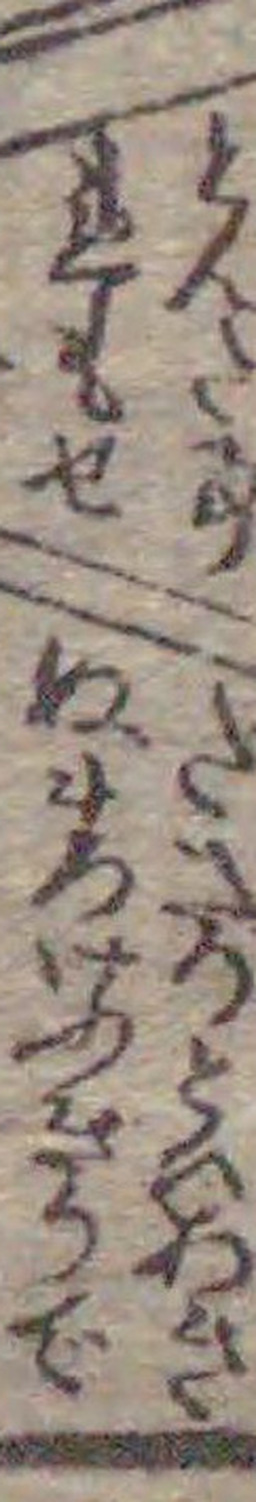れもせぬまつけふきりで
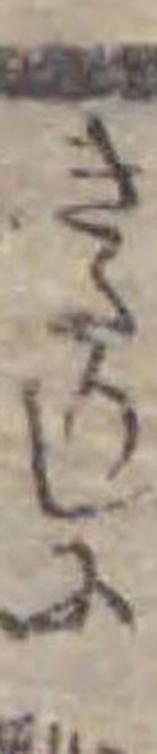きたりしに
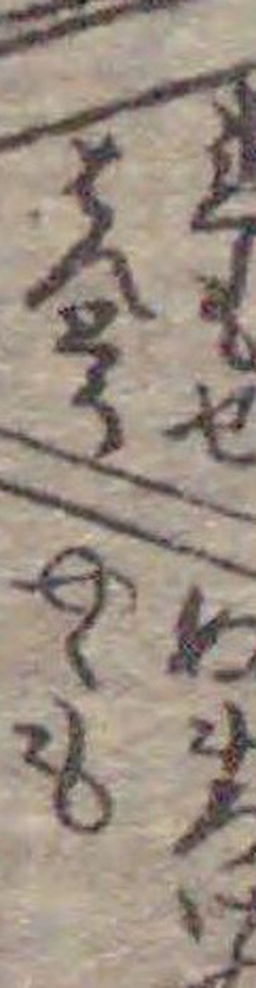はんとうやくも
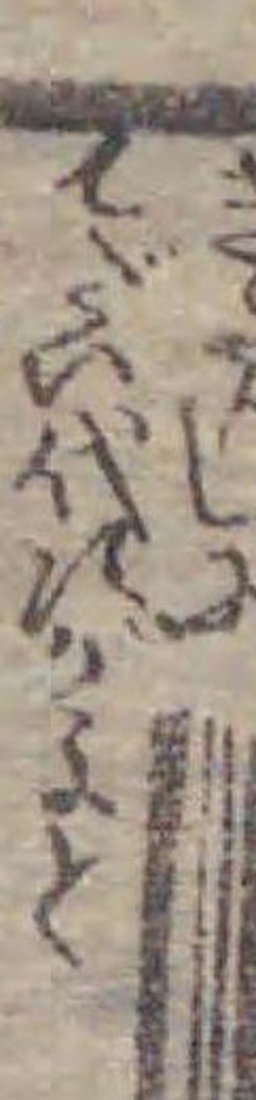てだい代次かよと
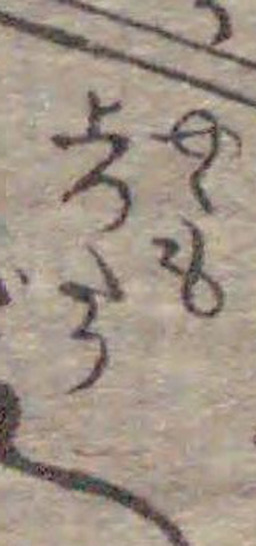上つたり
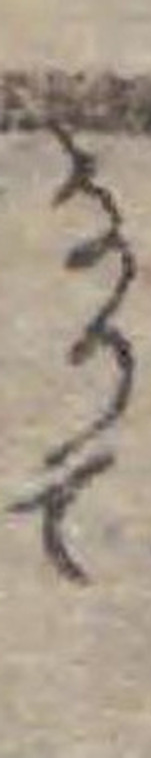なりて
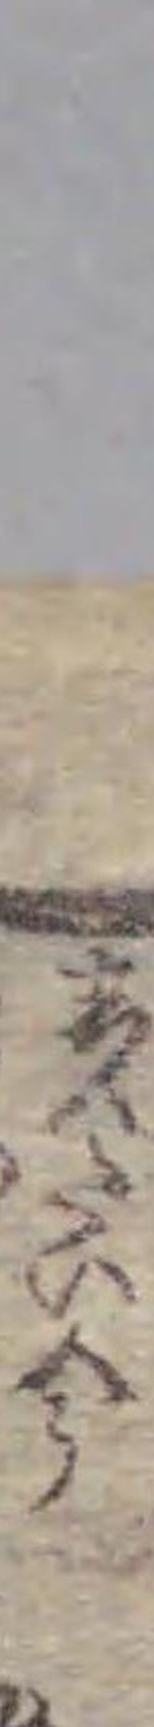しんだい今
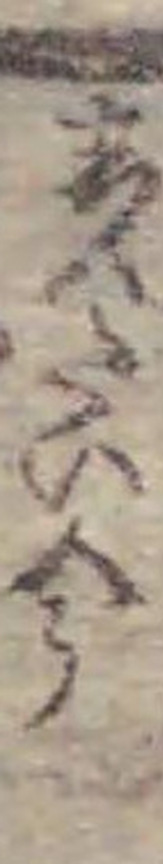しんだい今
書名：見徳一炊夢 : 3巻
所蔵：国立国会図書館 National Diet Library, JAPAN
